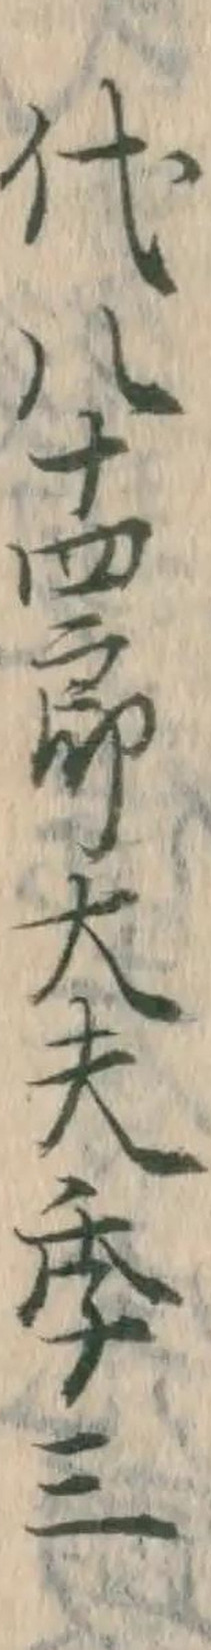代八十四郎大夫季三
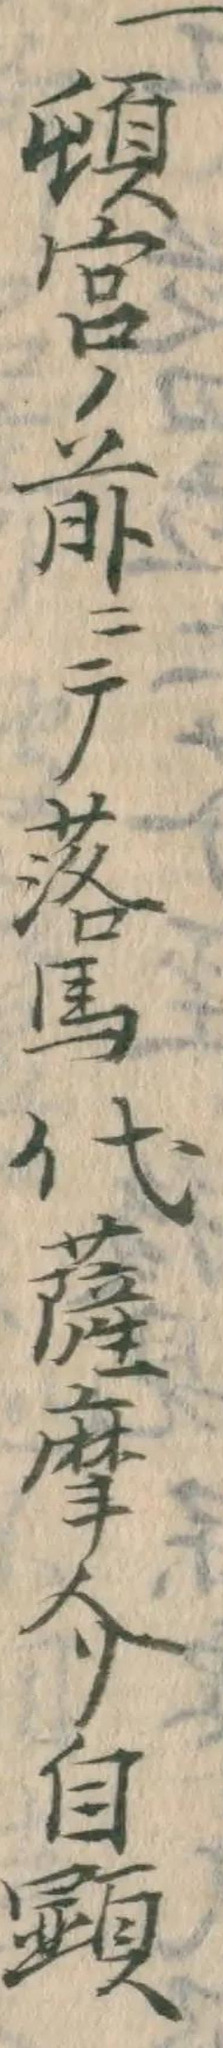(頓宮ノ前ニテ落馬代薩摩介自顕
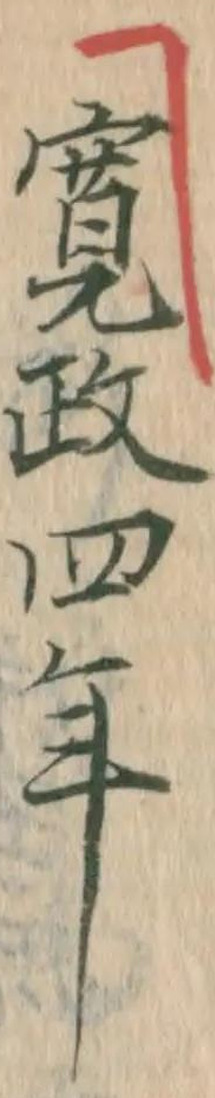寛政四年
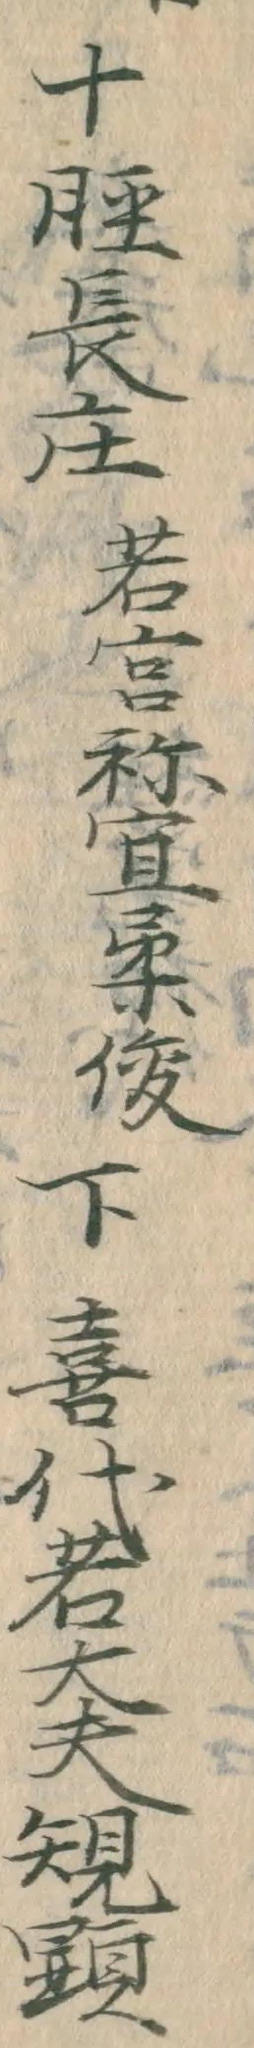十脛長庄若宮祢宜柔俊下喜代若大夫規顕
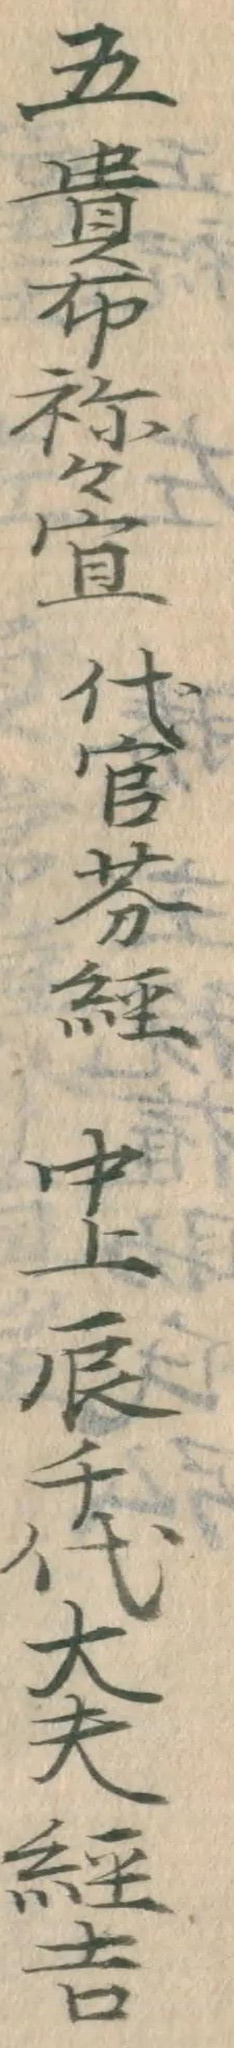五貴布祢々宜代官芬経中上辰千代大夫経吉
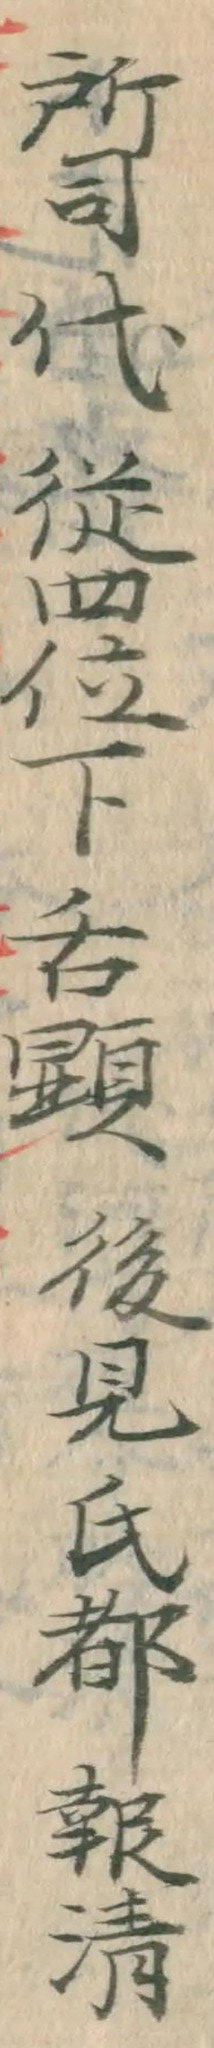所司代従四位下舌顕後見氏都報清
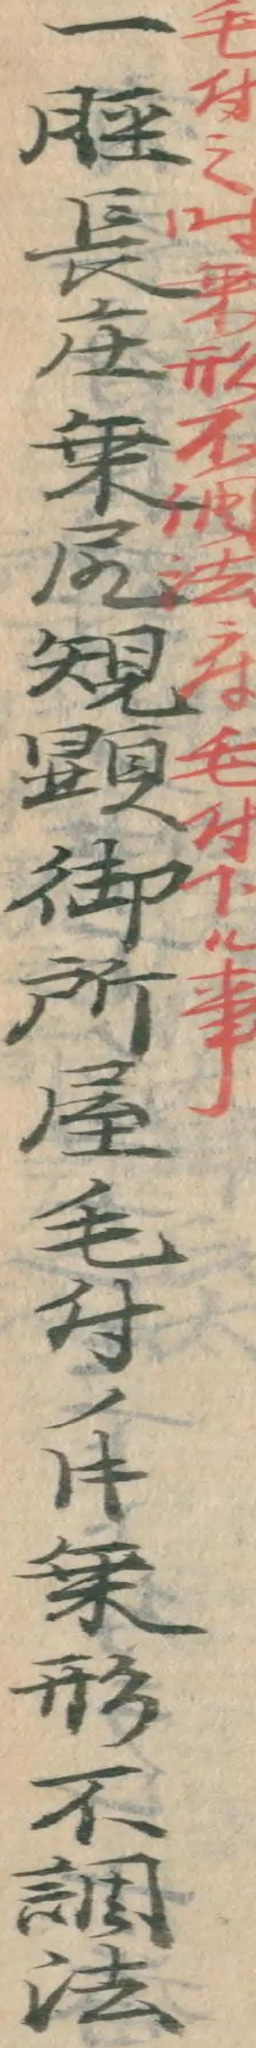一脛長庄乗尻規顕御所屋毛付ノトキ乗形不調法

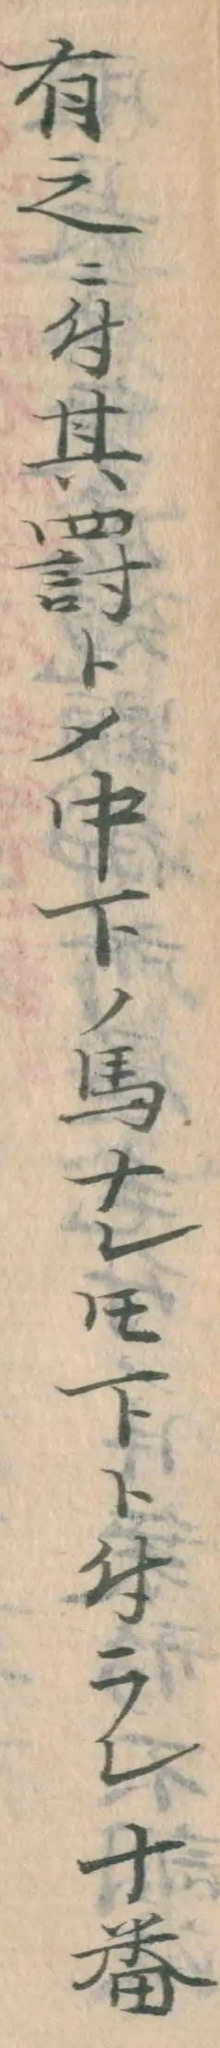有之ニ付其罰トシテ中下ノ馬ナレトモ下ト付ラレ十番
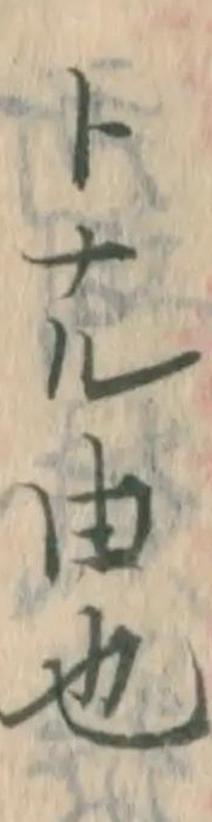トナル由也
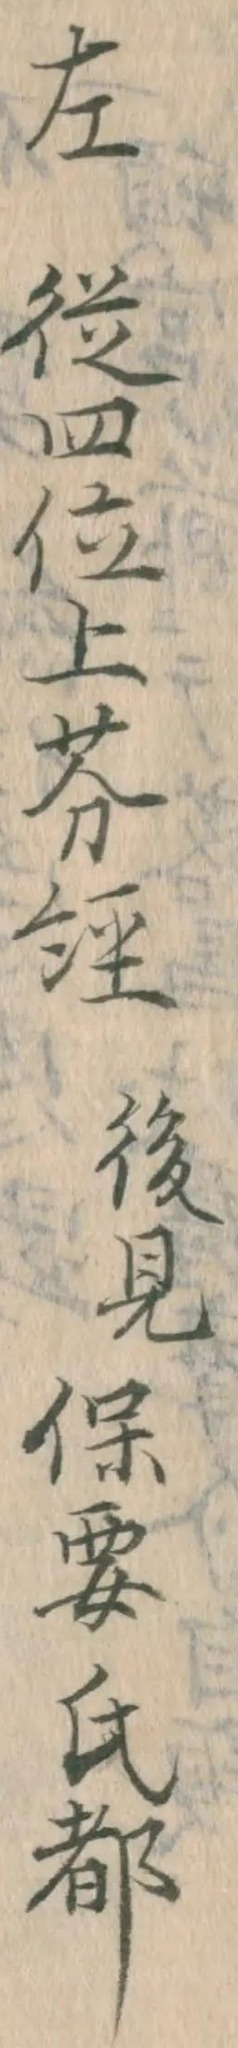左従四位上芬経後見保要氏都
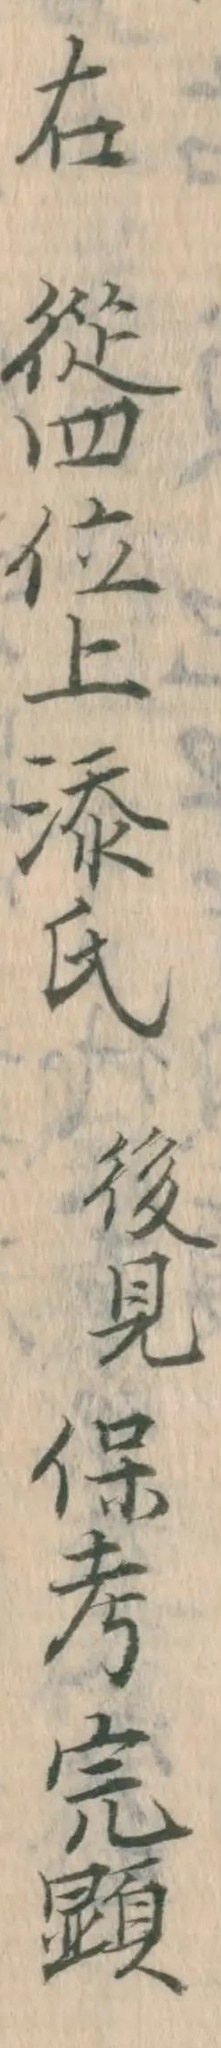右従四位上添氏後見保考完顕
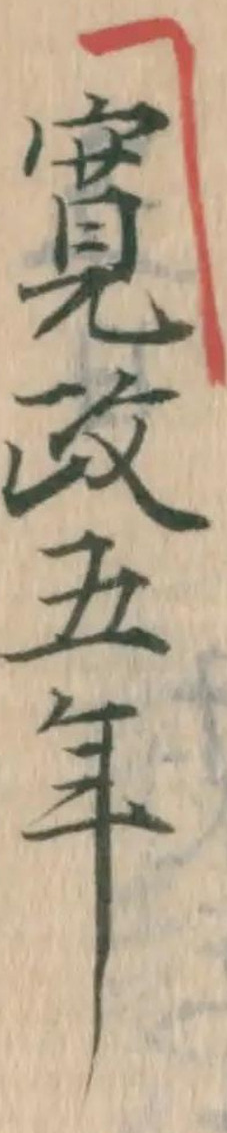寛政五年
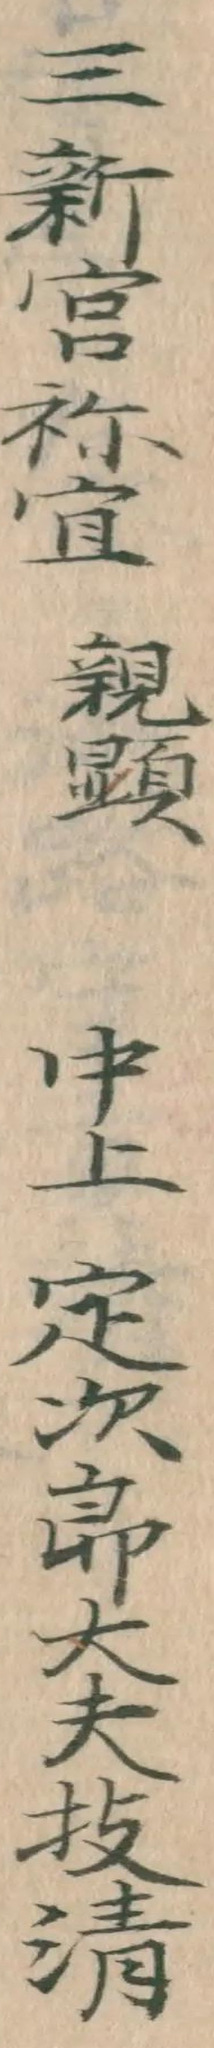三新宮祢宜親顕中上定次郎大夫枝清
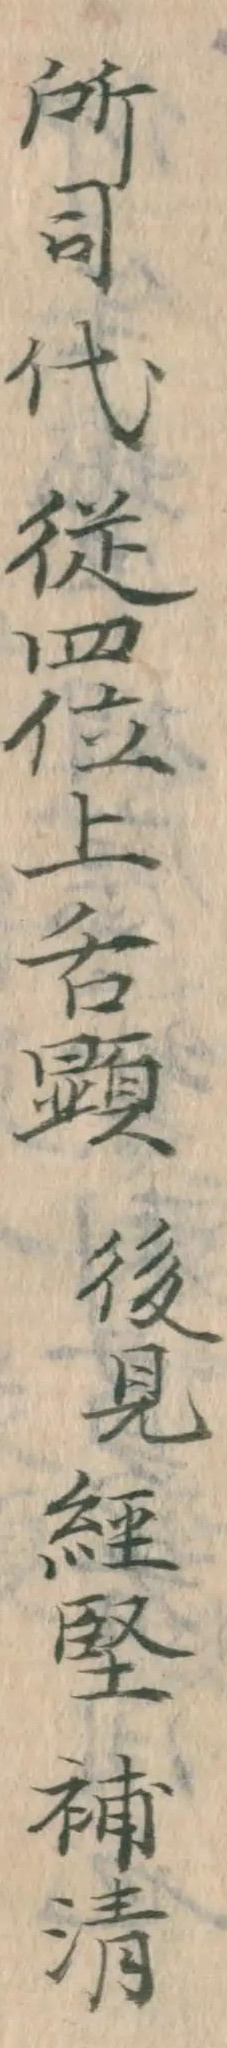所司代従四位上舌顕後見経堅補清
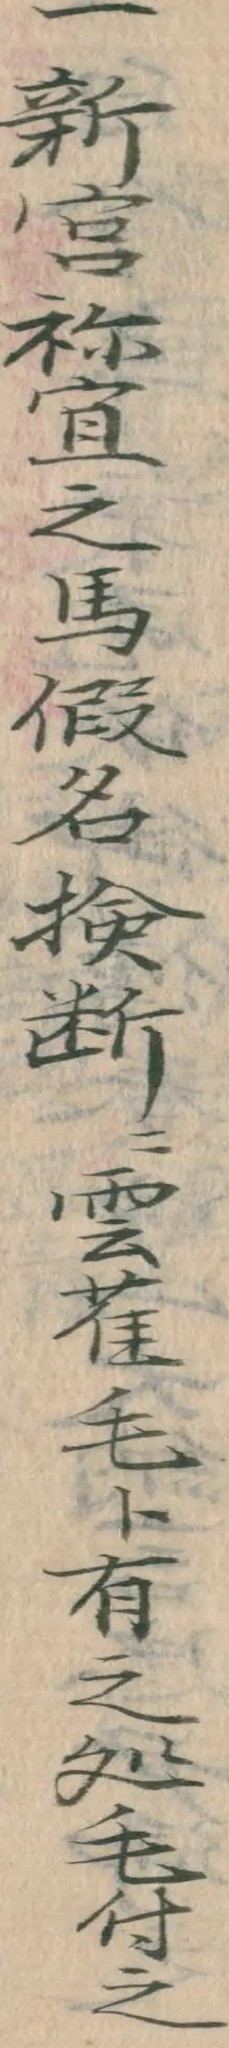一新宮祢宜之馬仮名検断ニ雲雀毛ト有之処毛付之
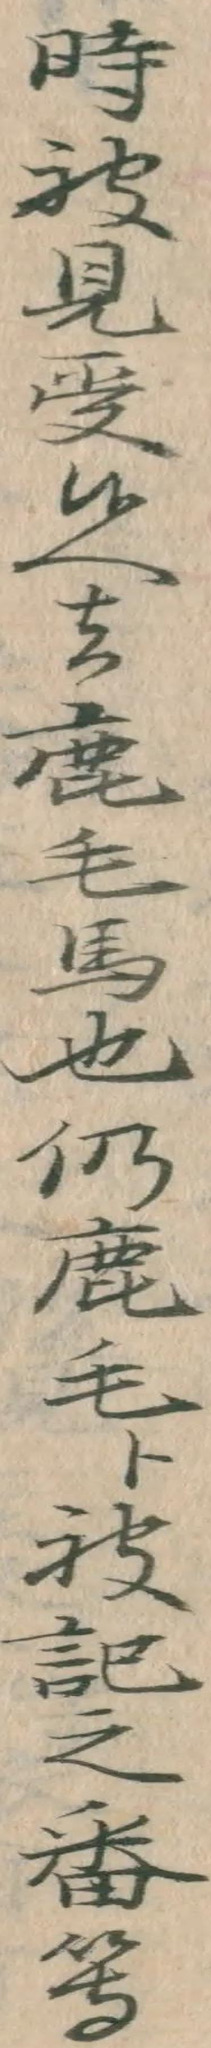時被見受候ヘ者鹿毛馬也仍鹿毛ト被記之番等
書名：賀茂社記録. 第10冊
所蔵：国立国会図書館 National Diet Library, JAPAN
